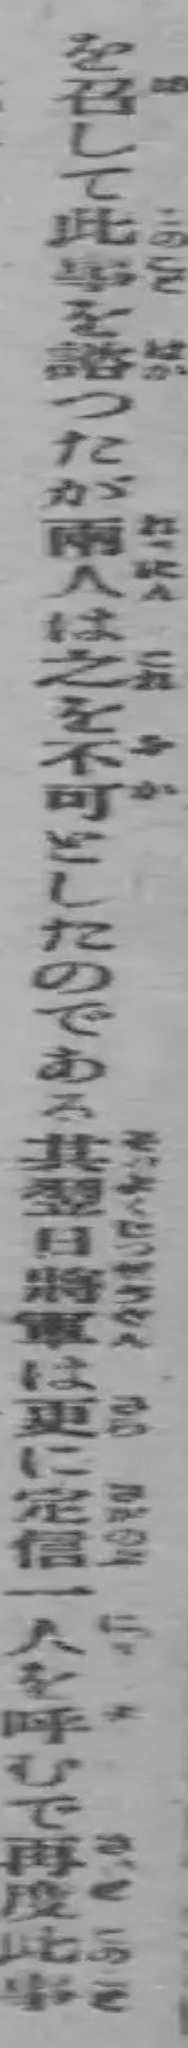を召して此事を諮つたが両人は之を不可としたのである其翌日将軍は更に定信一人を呼むで再度此事
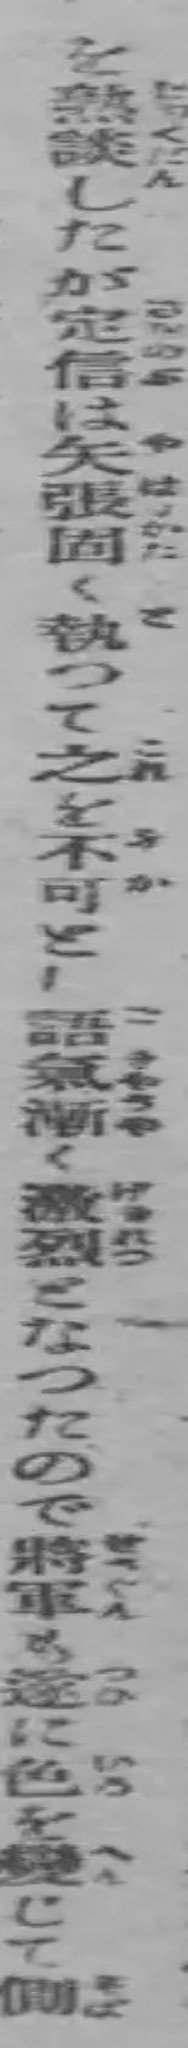を熟談したが定信は矢張固く執つて之を不可とし語気漸く激烈となつたので将軍も遂に色を変じて側
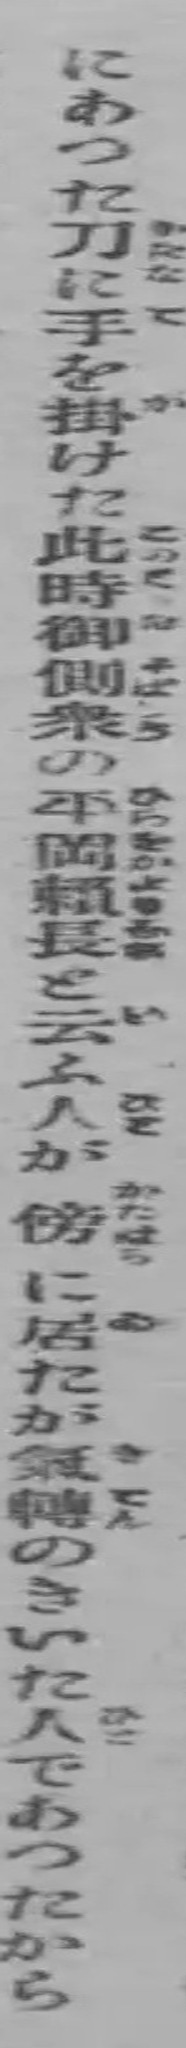にあつた刀に手を掛けた此時御側衆の平岡頼長と云ふ人が傍に居たが気転のきいた人であつたから
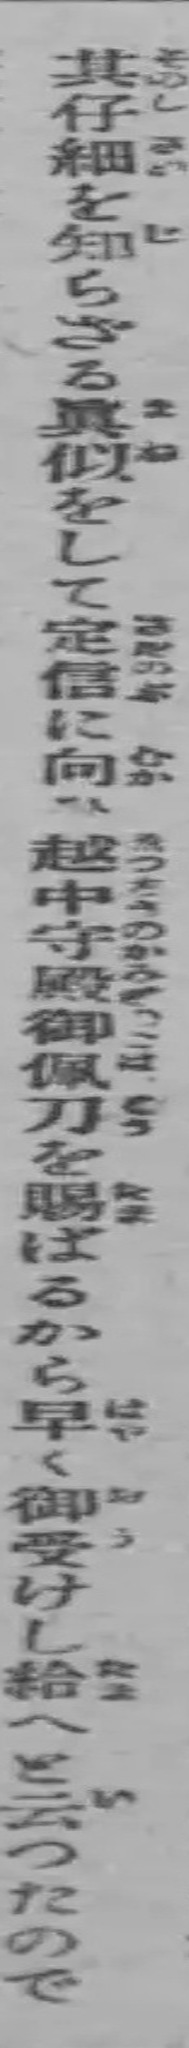其仔細を知らざる真似をして定信に向ひ越中守殿御佩刀を賜はるから早く御受けし給へと云つたので
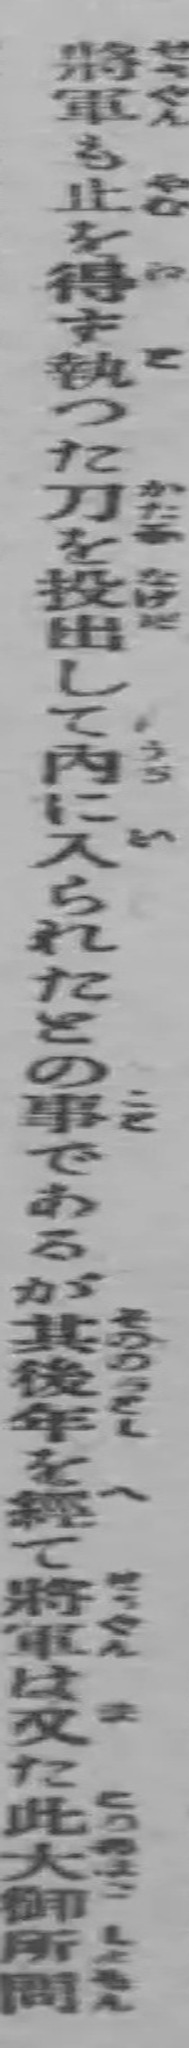将軍も止を得ず執つた刀を投出して内に入られたとの事であるが其後年を経て将軍は又た此大御所問
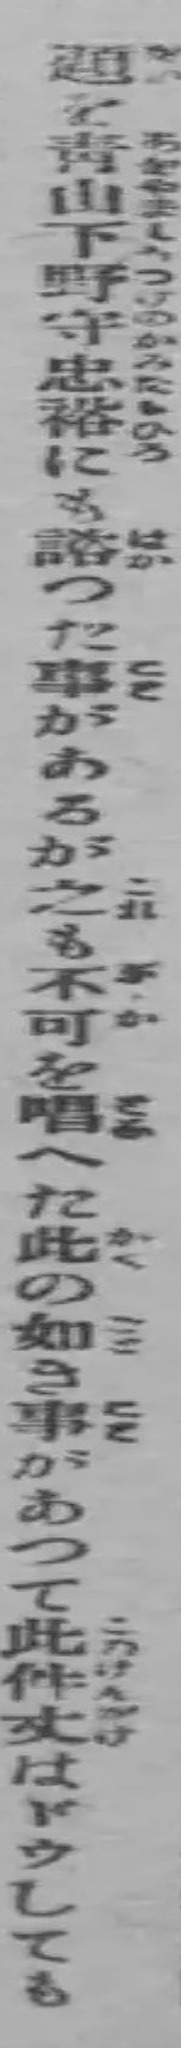題を青山下野守忠裕にも諮つた事があるが之も不可を唱へた此の如き事があつて此件丈はドウしても
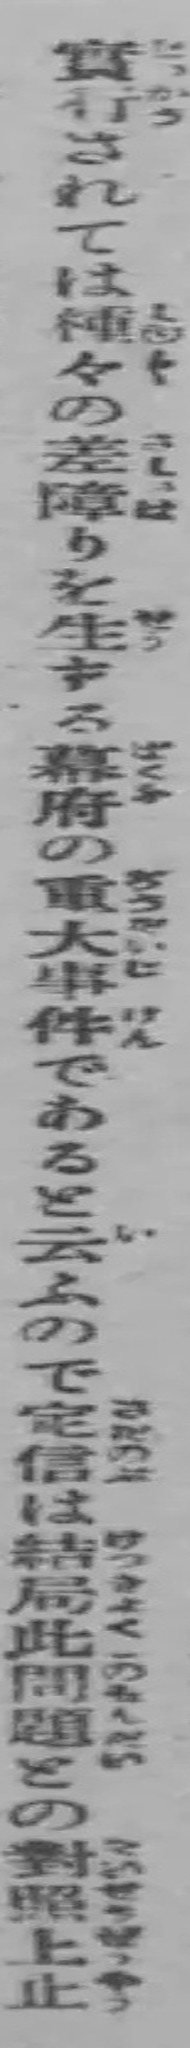実行されては種々の差障りを生ずる幕府の重大事件であると云ふので定信は結局此問題との対照上止
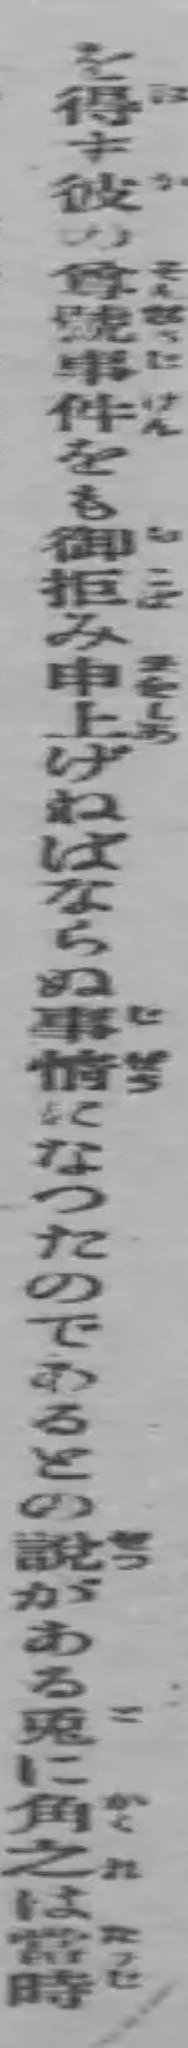を得ず彼の尊号事件をも御拒み申上げねばならぬ事情になつたのであるとの説がある兎に角之は当時
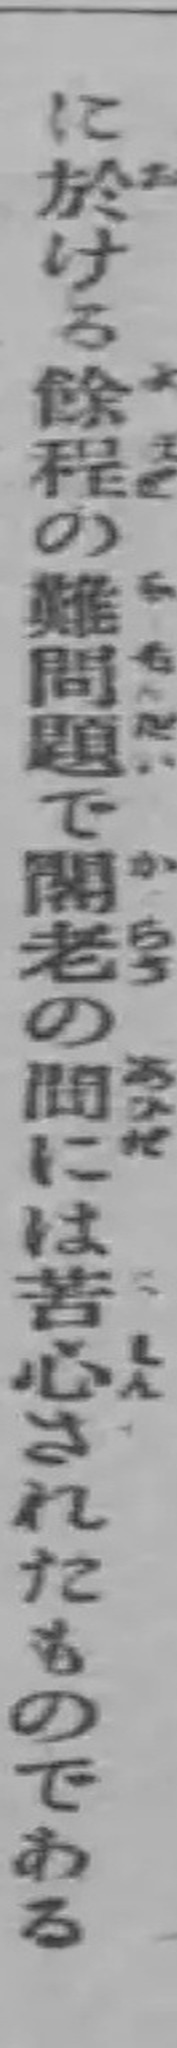に於ける余程の難問題で閣老の間には苦心されたものである
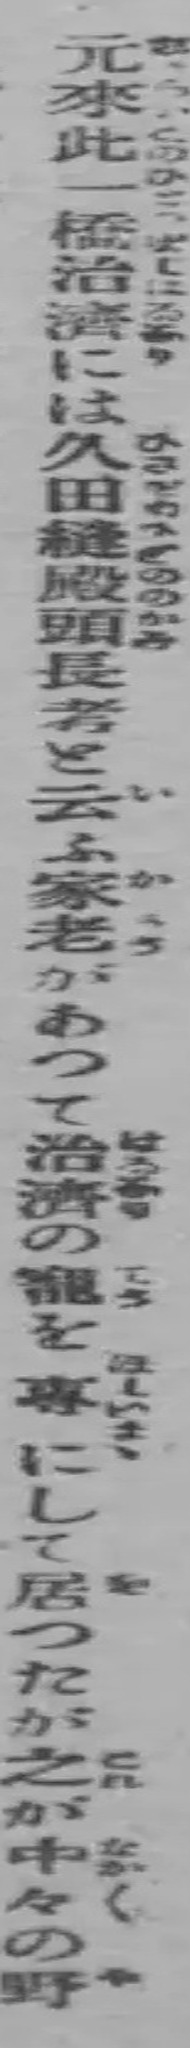久田縫殿頭元来此一橋治済には久田縫殿頭長考と云ふ家老があつて治済の寵を専にして居つたが之が中々の野
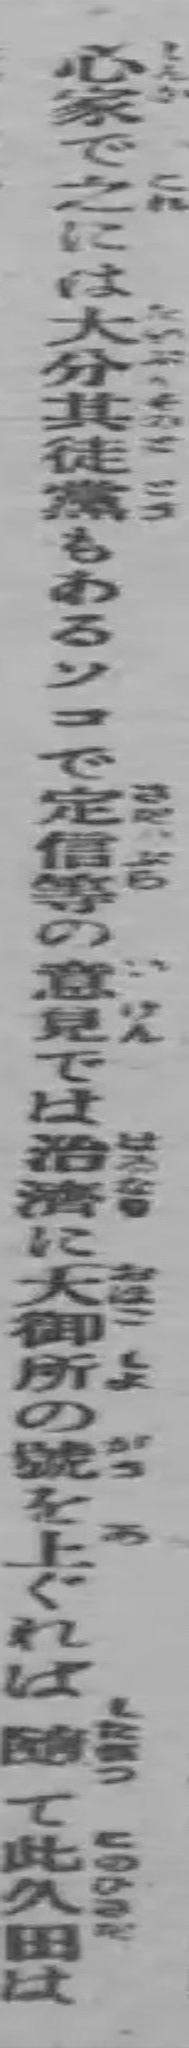心家で之には大分其徒党もあるそソコで定信等の意見では治済の大御所の号を上ぐれば随て此久田は
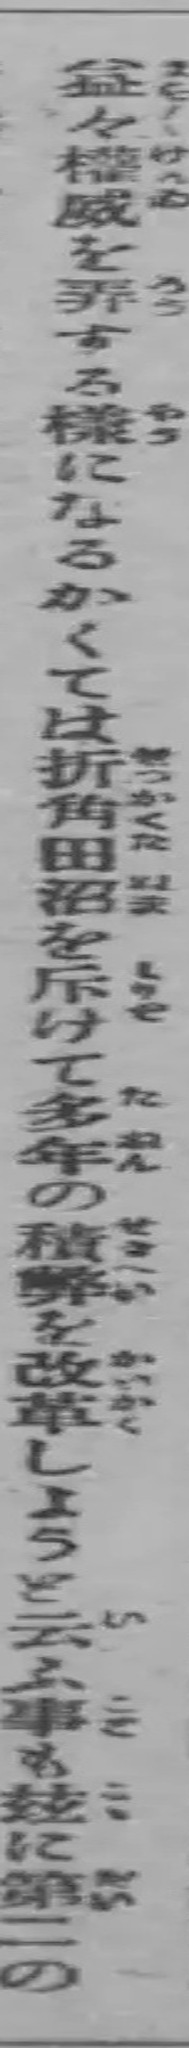益々権威を弄する様になるかくては折角田沼を斥けて多年の積弊を改革しようと云ふ事も茲に第二の
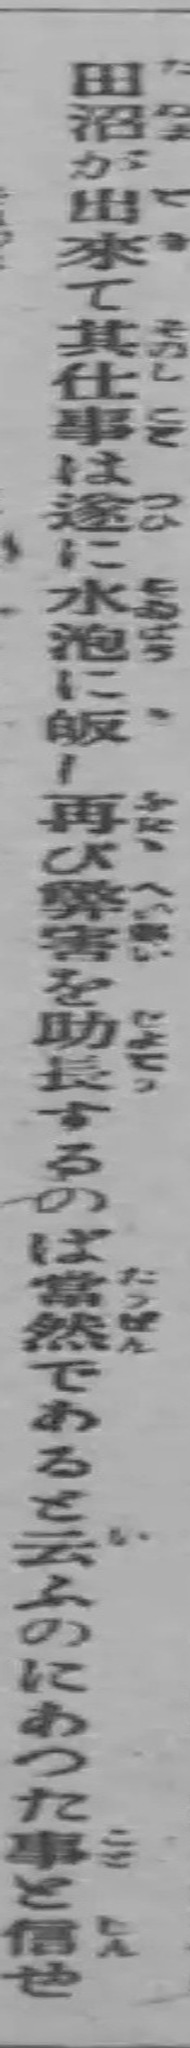田沼が出来て其仕事は遂に水泡に皈し再び弊害を助長するのは当然であると云ふのにあつた事と信ぜ
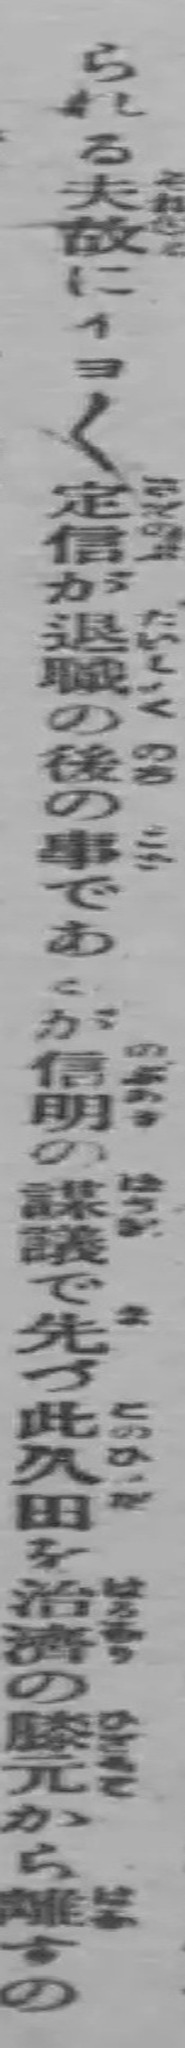られる夫故にイヨ〳〵定信が退職の後の事であるが信明の謀議で先づ此久田を治済の膝元から離すの
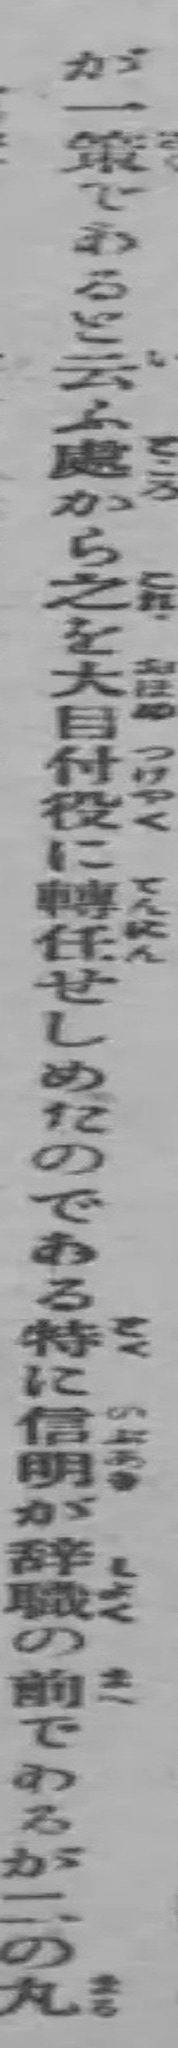が一策であると云ふ処から之を大目付役に転任せしめたのである特に信明が辞職の前であるが二の丸
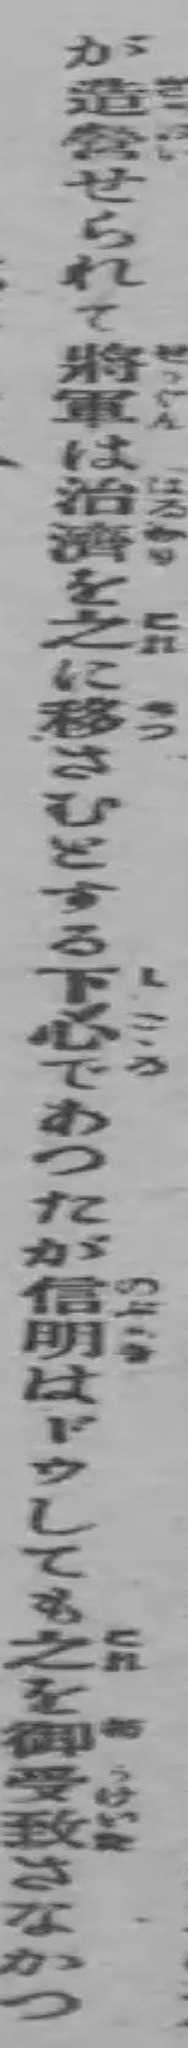が造営せられて将軍は治済を之に移さむとする下心であつたが信明はドウしても之を御受致さなかつ
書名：豊橋市史談
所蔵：国立国会図書館 National Diet Library, JAPAN
